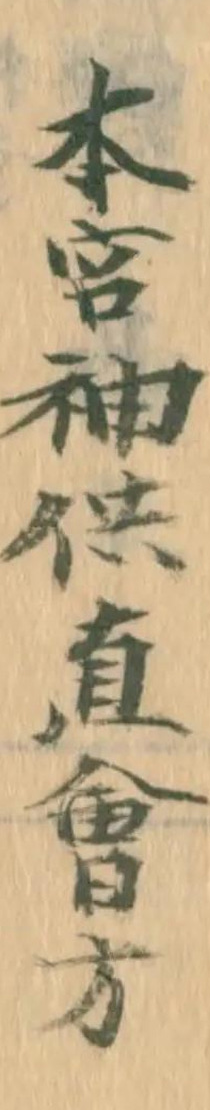本宮神供直会方
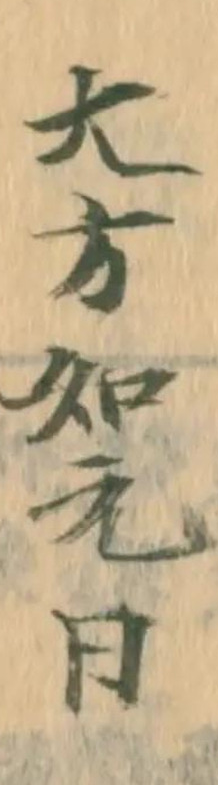大方如元日
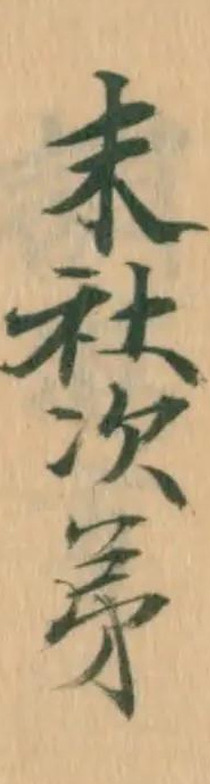末社次第
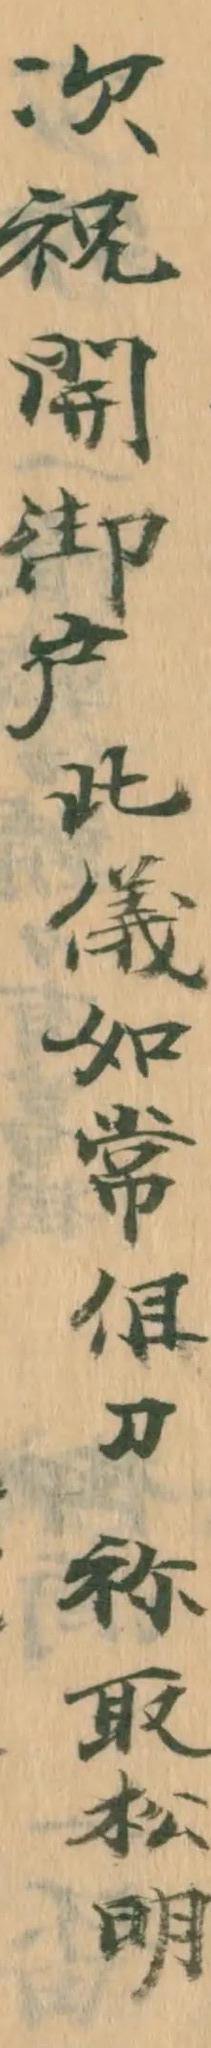次祝開御座此儀如常但刀禰取松明
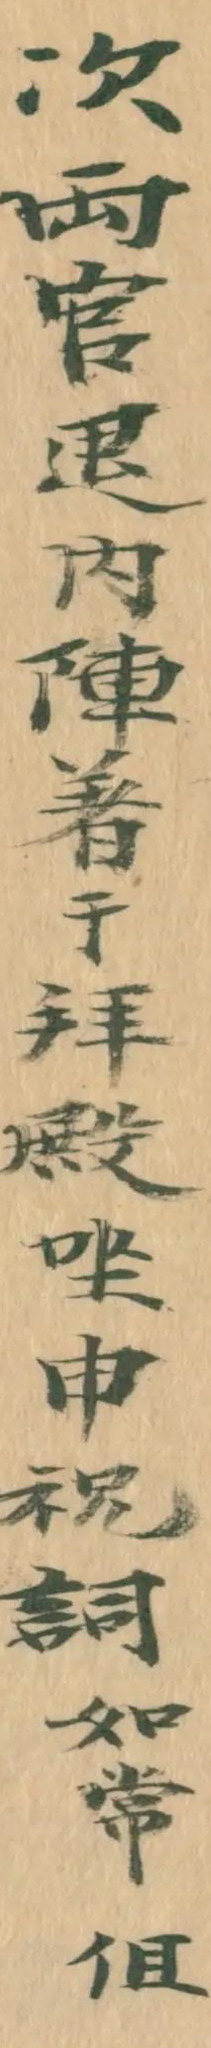次両官退内陣着于拝殿坐申祝詞如常但
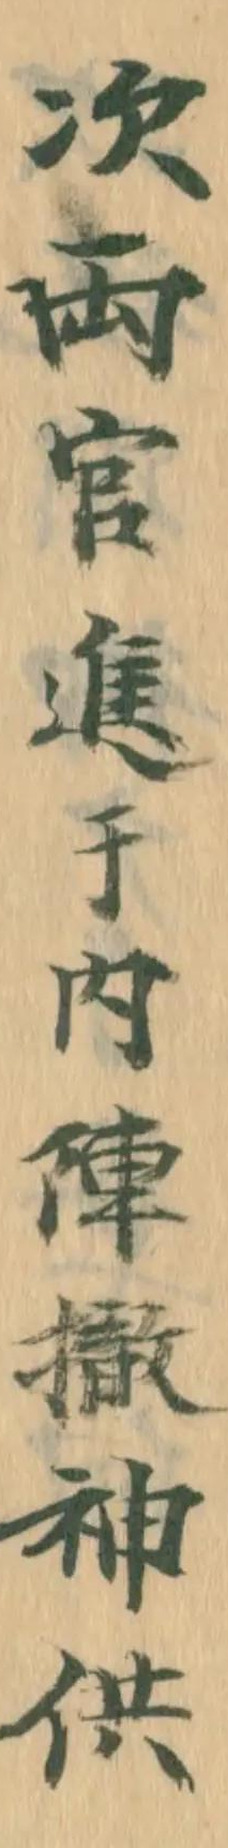次両官進于内陣徹神供

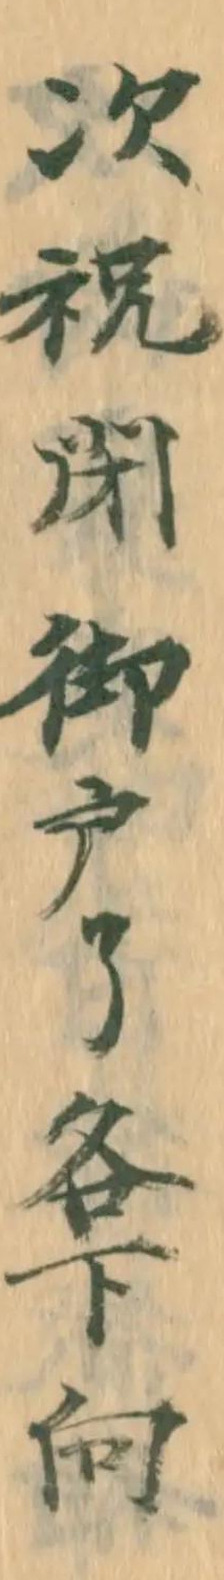次祝閉御戸了各下向
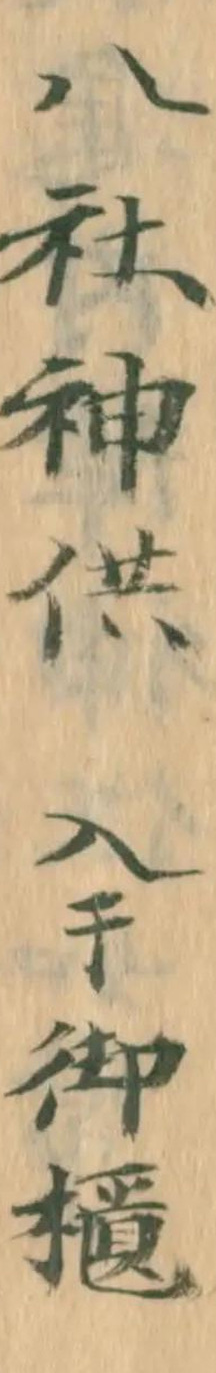八社神供入于御櫃
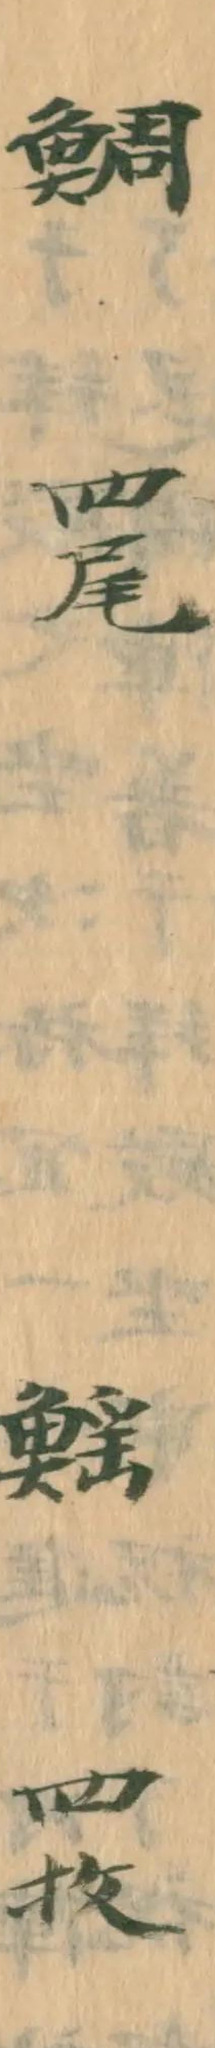鯛四尾鰩四枚
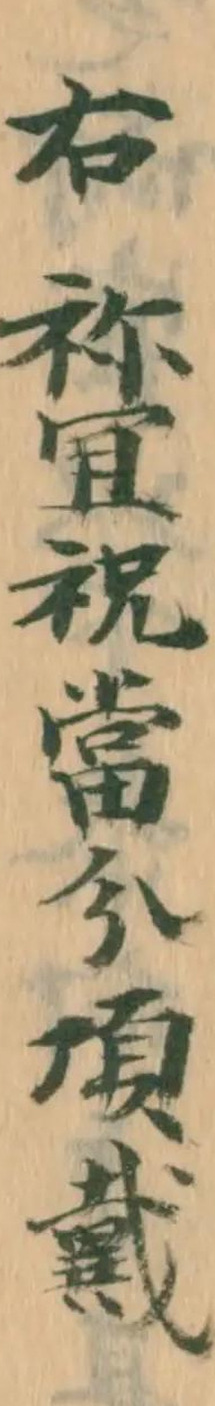右禰宜祝当分頂戴
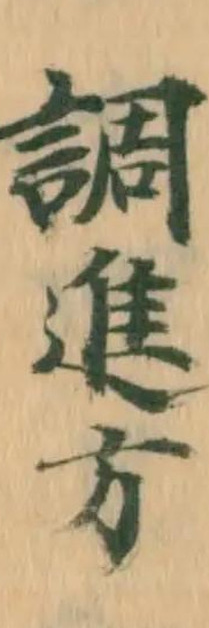調進方
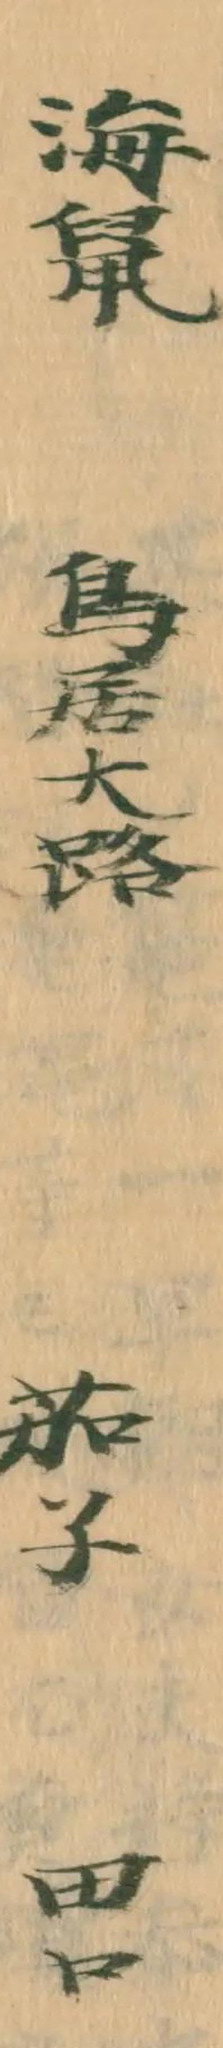海鼠鳥居大路茄子田口
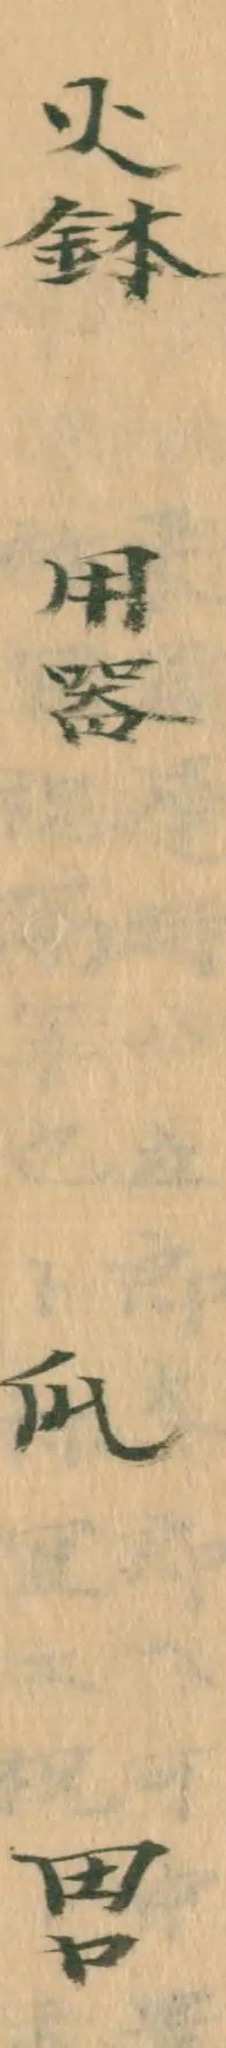火鉢用器瓜田口

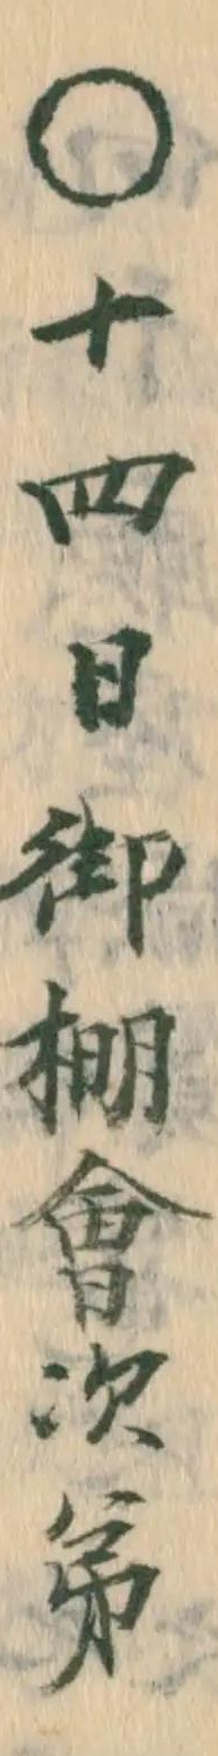○十四日御棚会次第
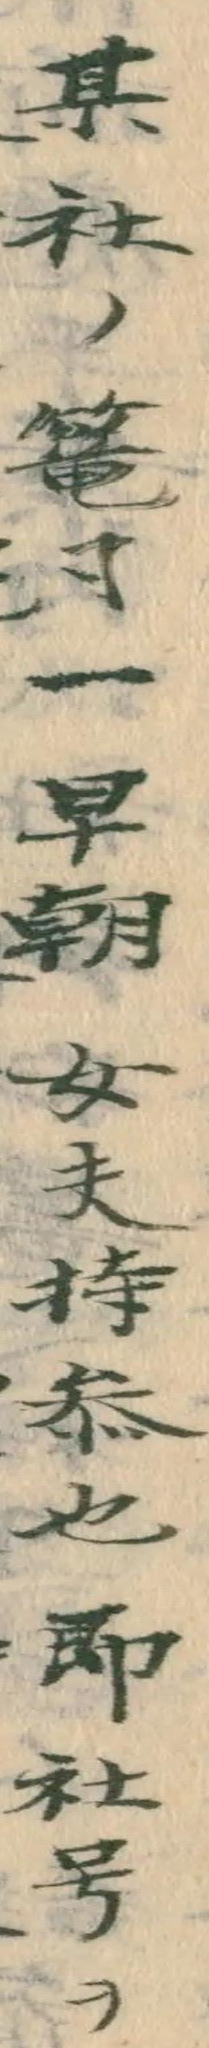某社ノ篭司一早朝女夫持参也即社号ヲ
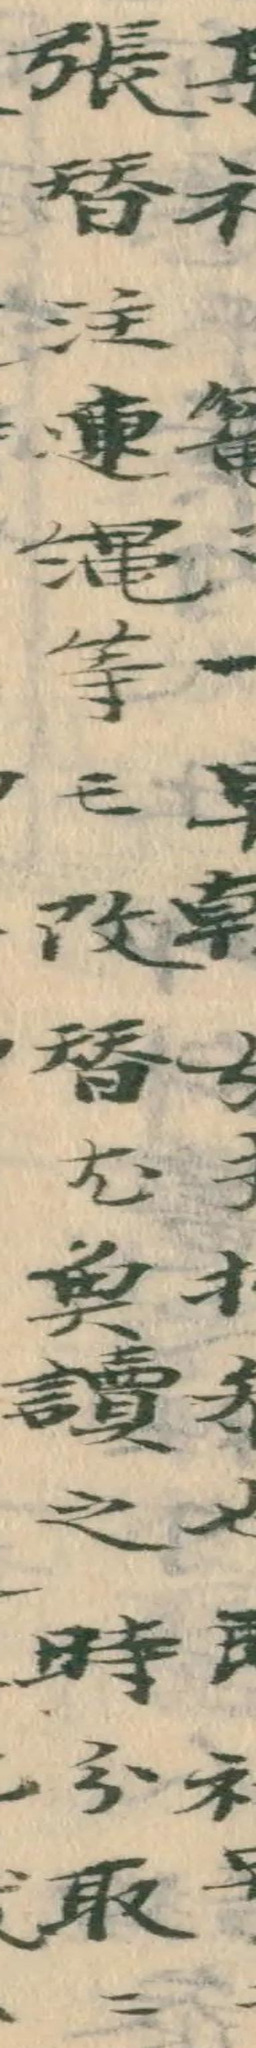張替注連縄等モ改替尤魚読之時分取ニ
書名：賀茂社記録. 第5冊
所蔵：国立国会図書館 National Diet Library, JAPAN
